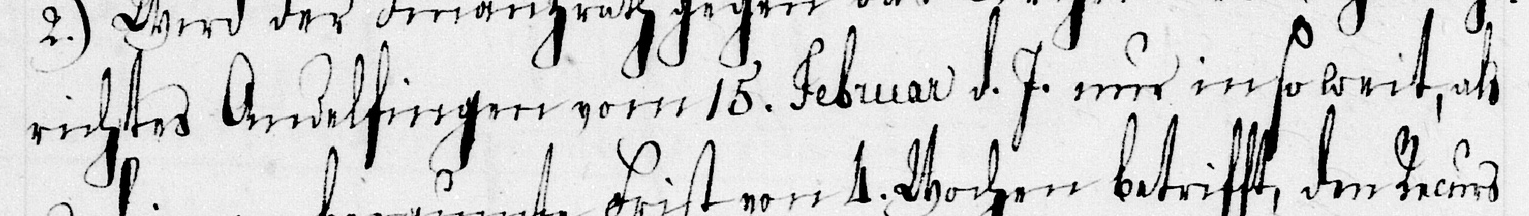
richtes Andelfingen vom 15. Februar d. J. nur insoweit, als
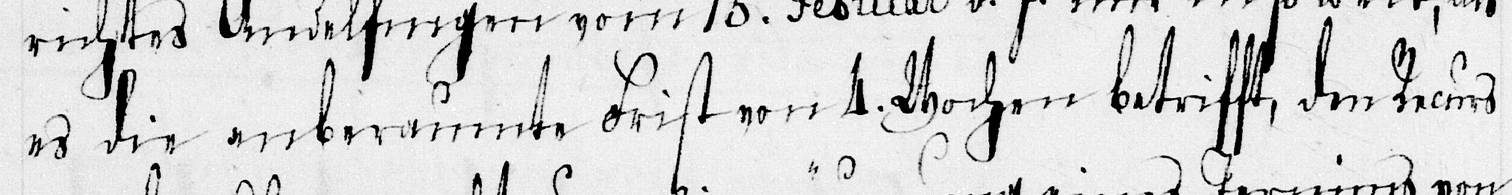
es die anberaumte Frist von 4. Wochen betrifft, den Recu¬
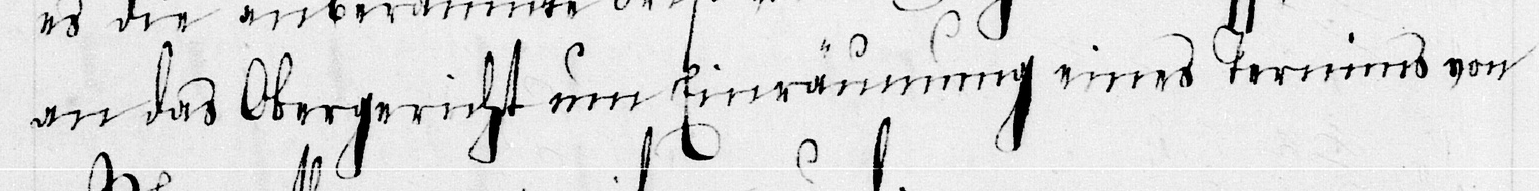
an das Obergericht um Einräumung eines Termins von
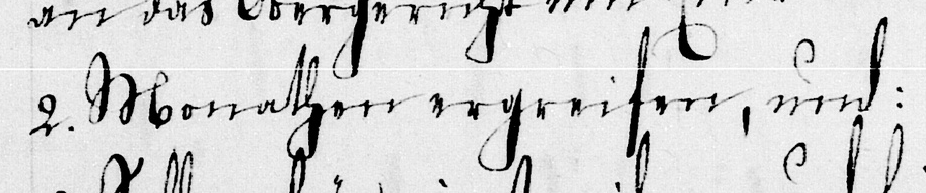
2. Monathen ergreifen, und:
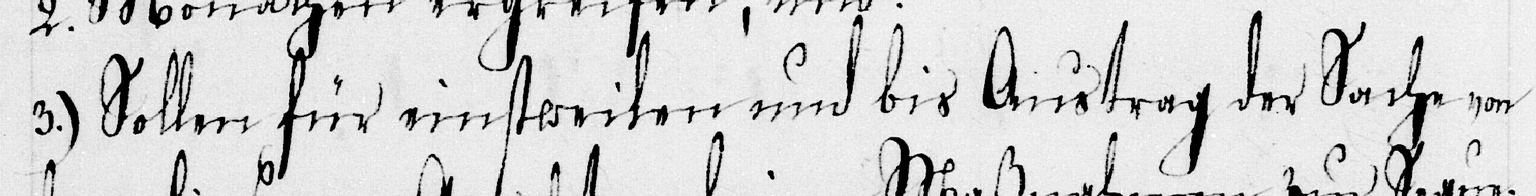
3.) Sollen für einstweilen und bis Austrag der Sache von
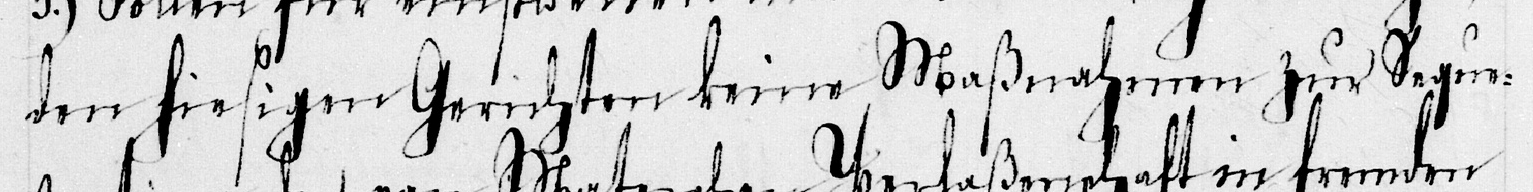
den hiesigen Gerichten keine Maßnahmen zur Seque¬
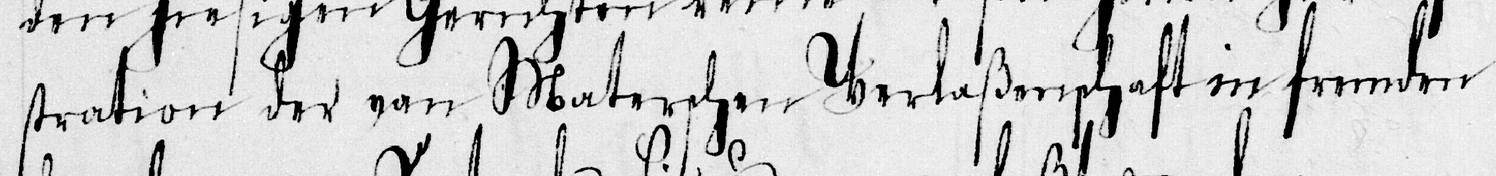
stration der van Materschen Verlaßenschaft in fremden
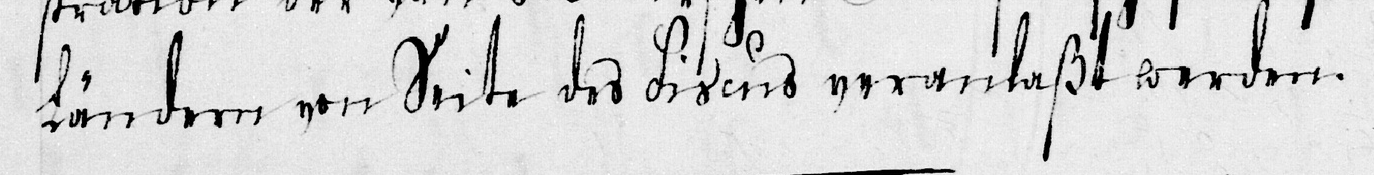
Ländern von Seite des Fiscus veranlaßt werden.
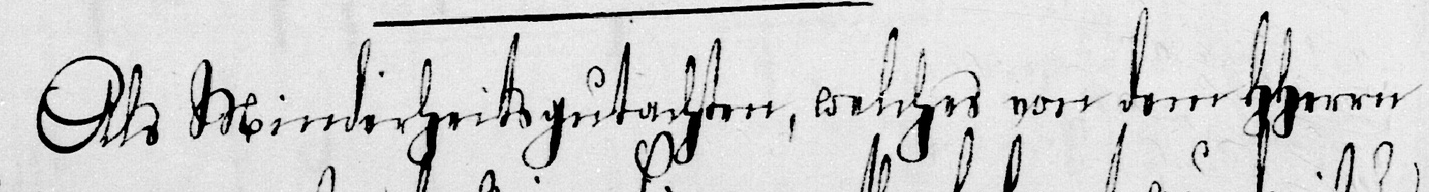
Als Minderheitsgutachten, welches von dem HHerrn
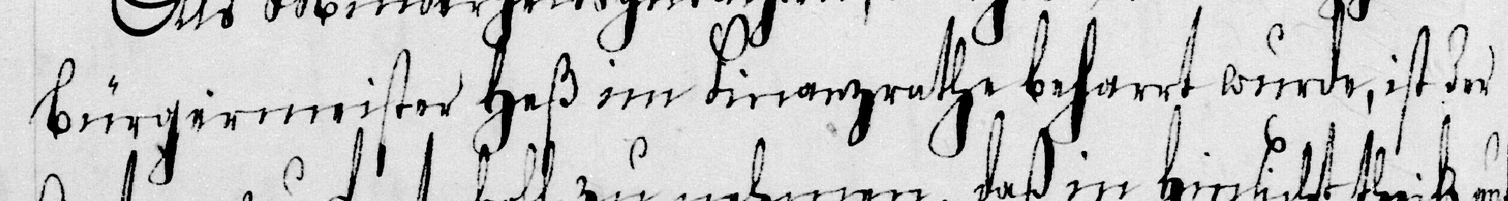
Bürgermeister Heß im Finanzrathe beharrt wurde, ist der
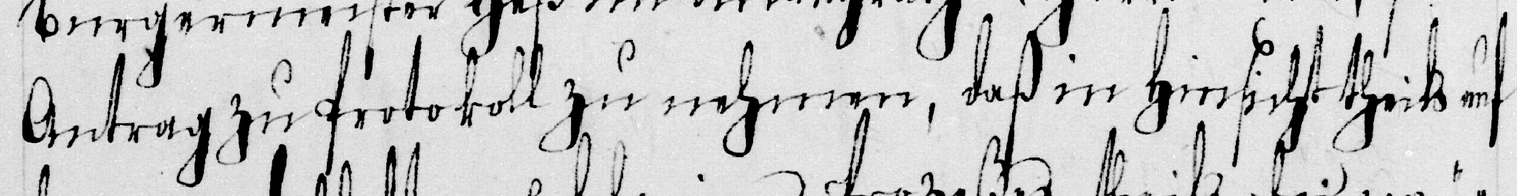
Antrag zu Protokoll zu nehmen, daß in Hinsicht theils
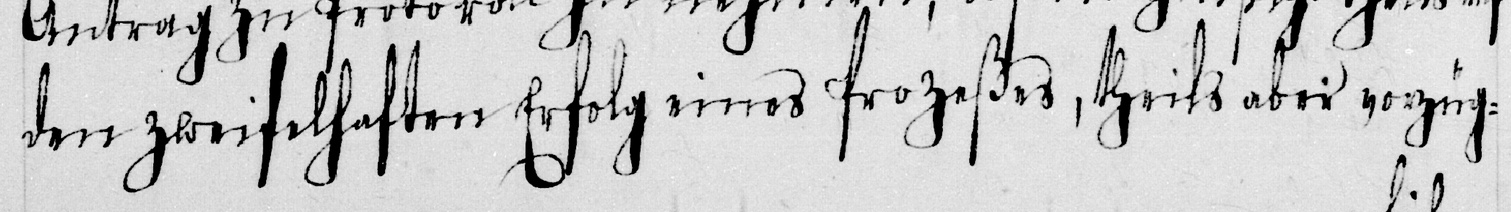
den zweifelhaften Erfolg eines Prozeßes, theils aber vorzüg-
